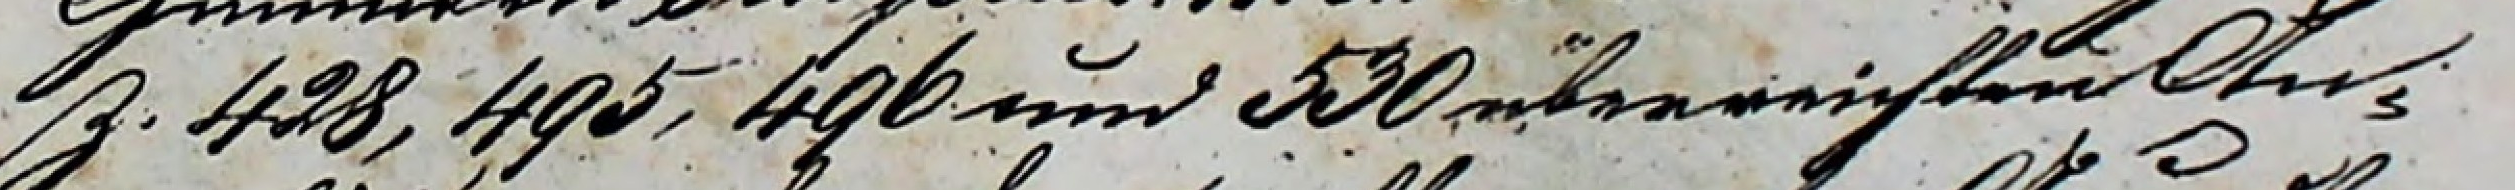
Z. 428, 495, 496 und 530 überreichten An„
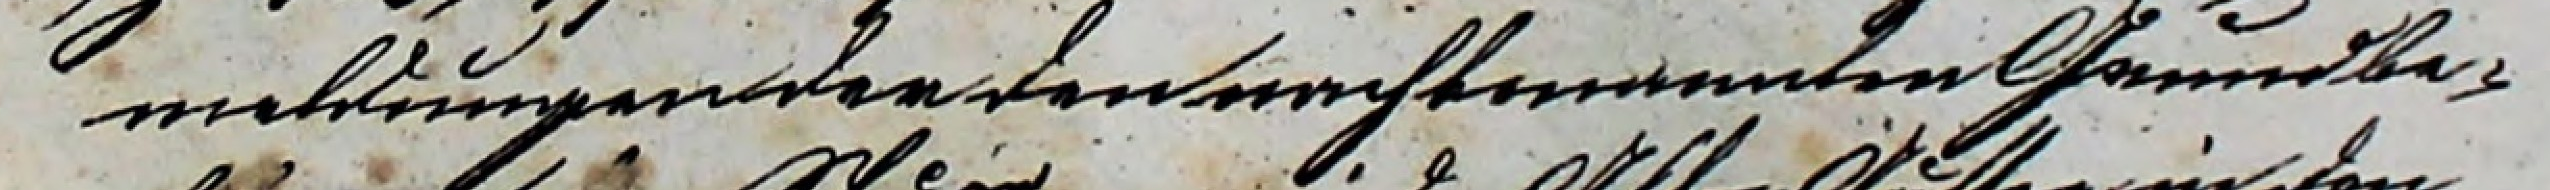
meldungen der den nach bekannten Grundbe„
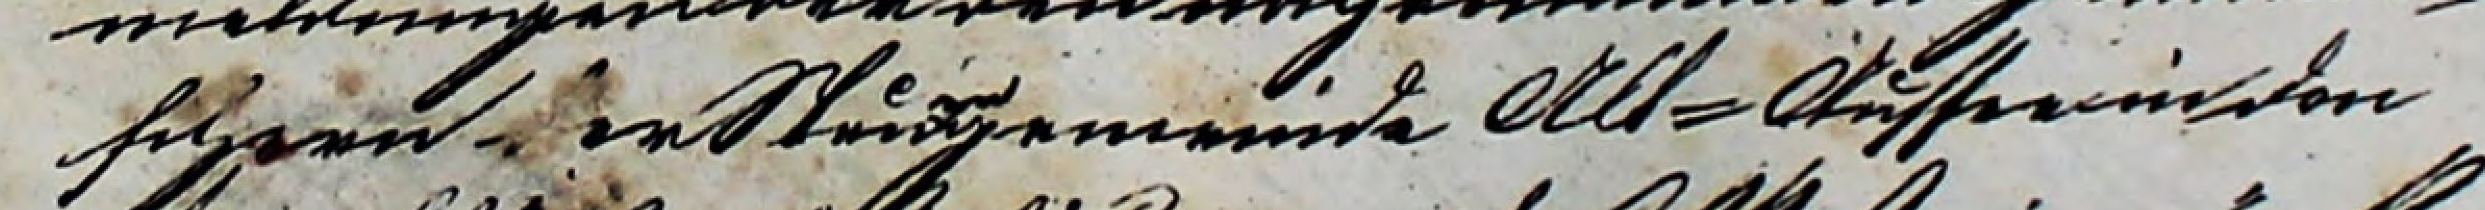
sitzern der Steuergemeinde Alt=Aussee in den
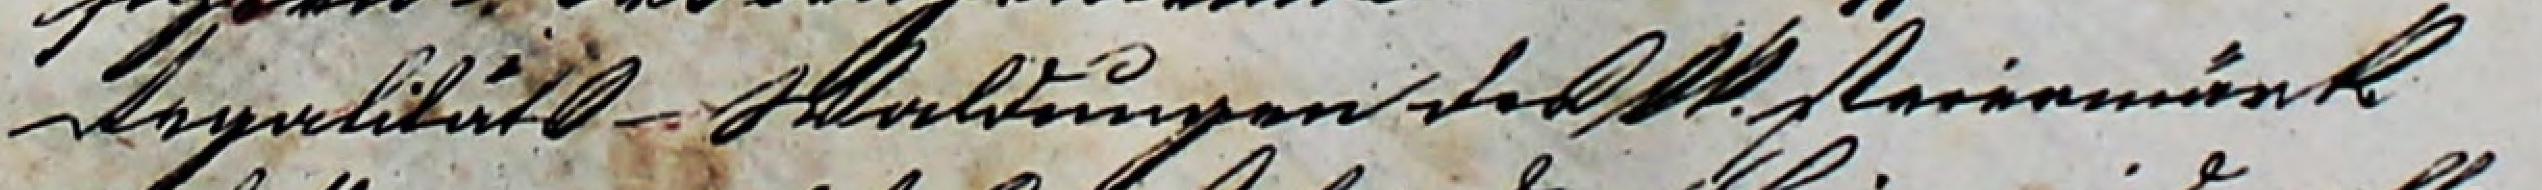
Regalitäts-Waldungen des kk. steiermärk
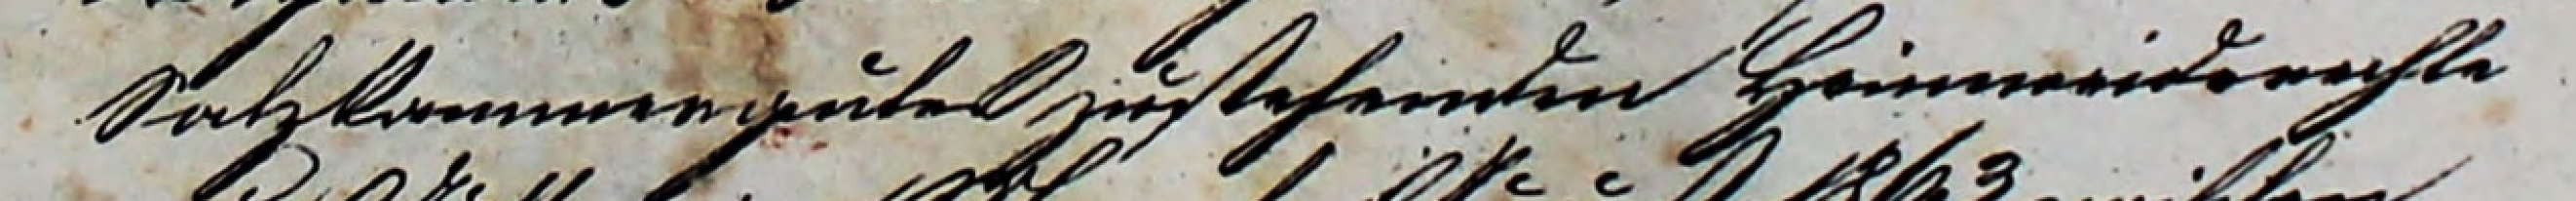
Salzkammergutes zustehenden Heimweiderechte
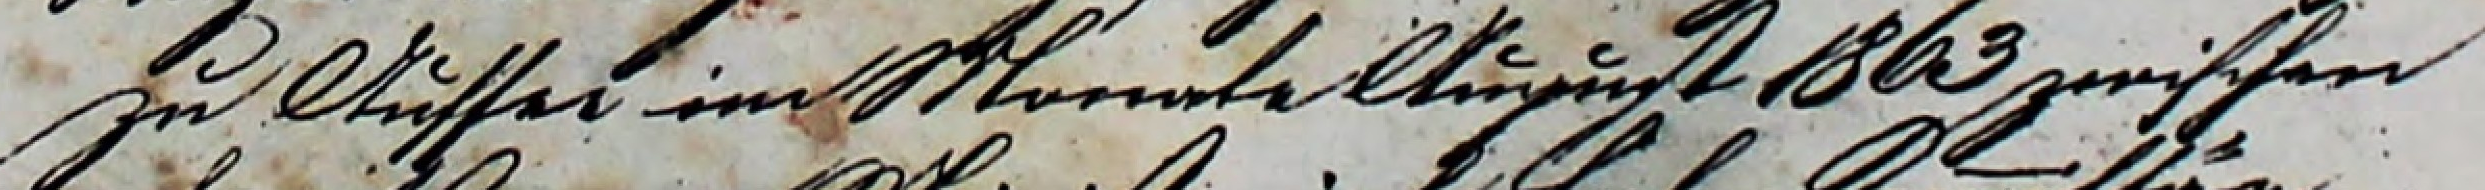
zu Aussee im Monate August 1863 zwischen
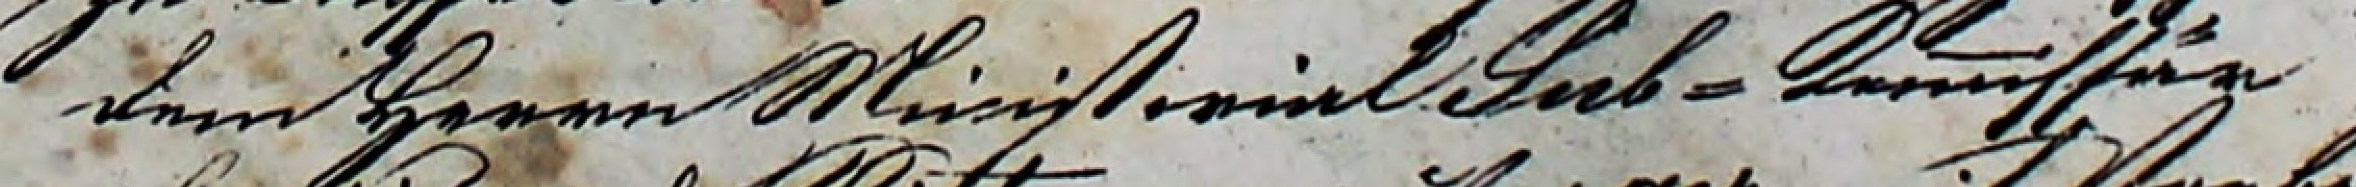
dem Herrn Ministerial Sub= Kommissär
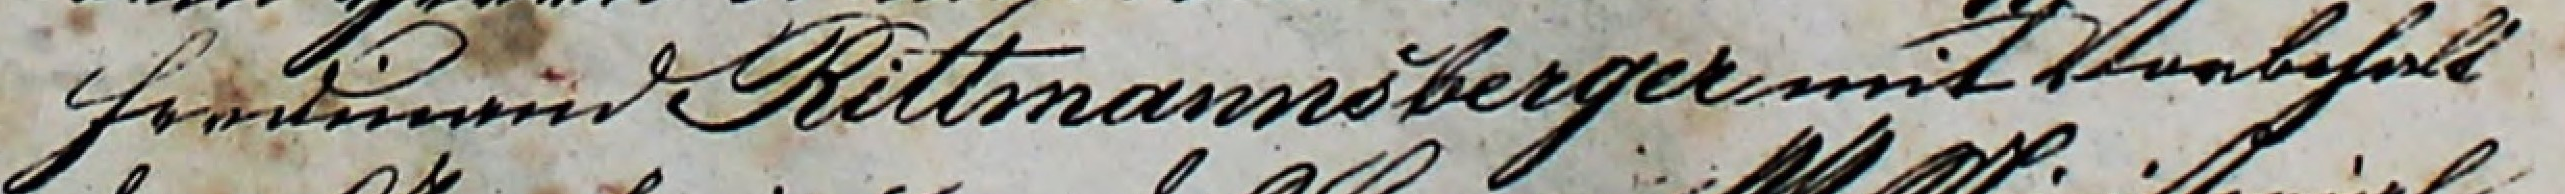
Ferdinand Rittmannsberger mit Vorbehalt
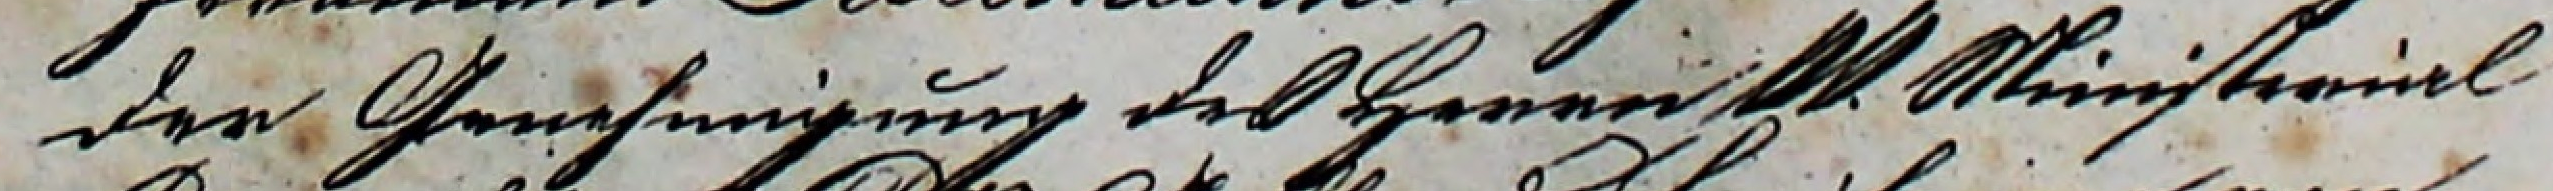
der Genehmigung des Herrn kk. Ministerial
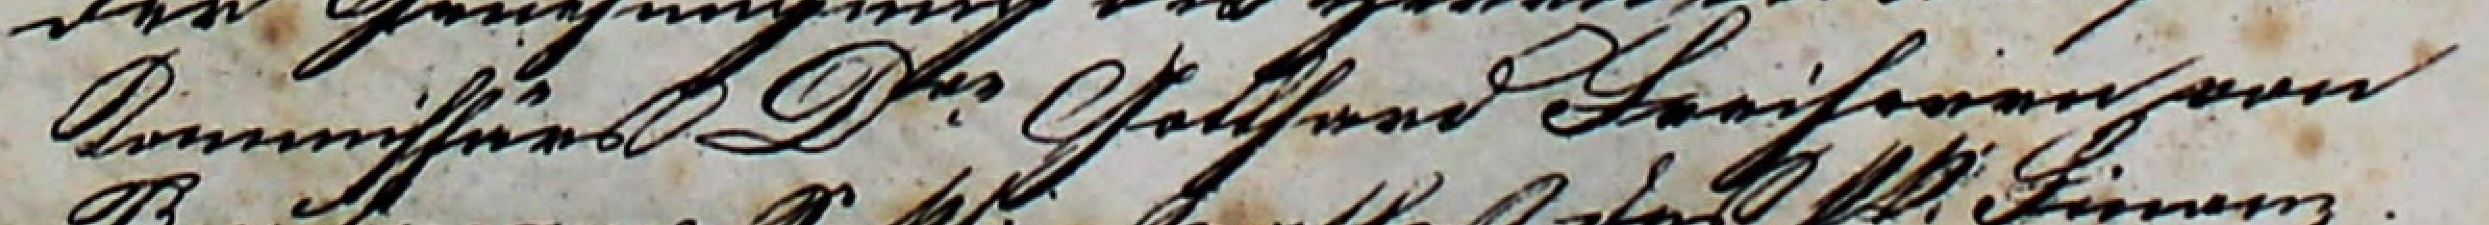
Kommissärs D?? Gotthard Freiherrn von
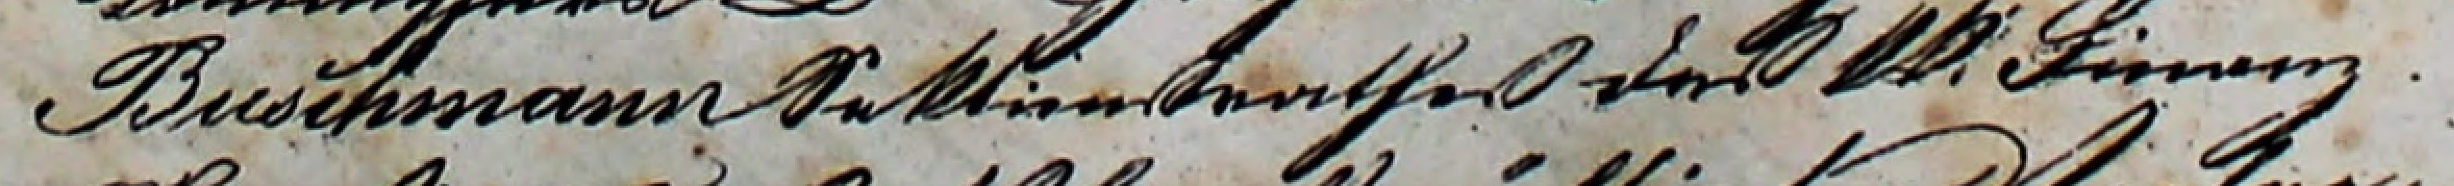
Buschmann Sektionsrathes des kk. Finanz
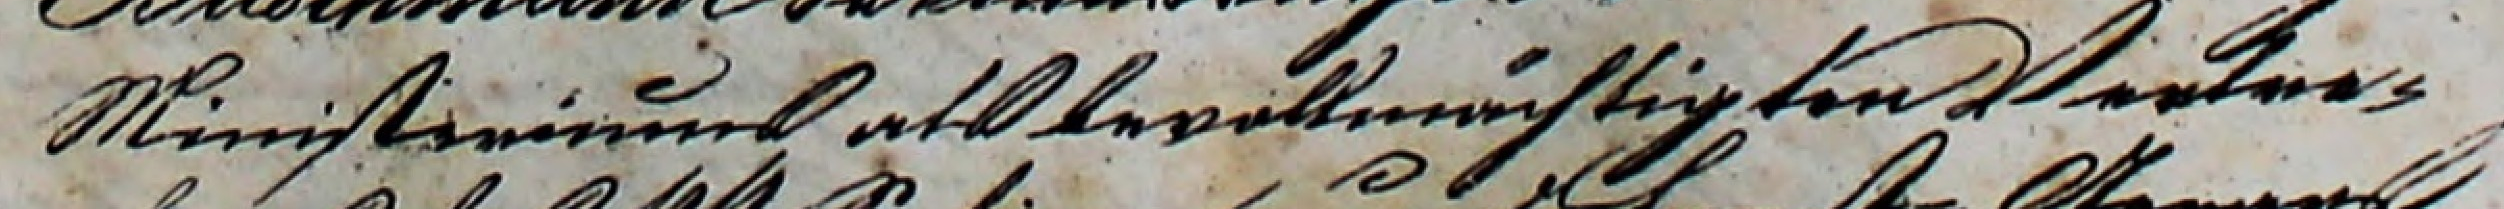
Ministeriums als bevollmächtigten Vortre„
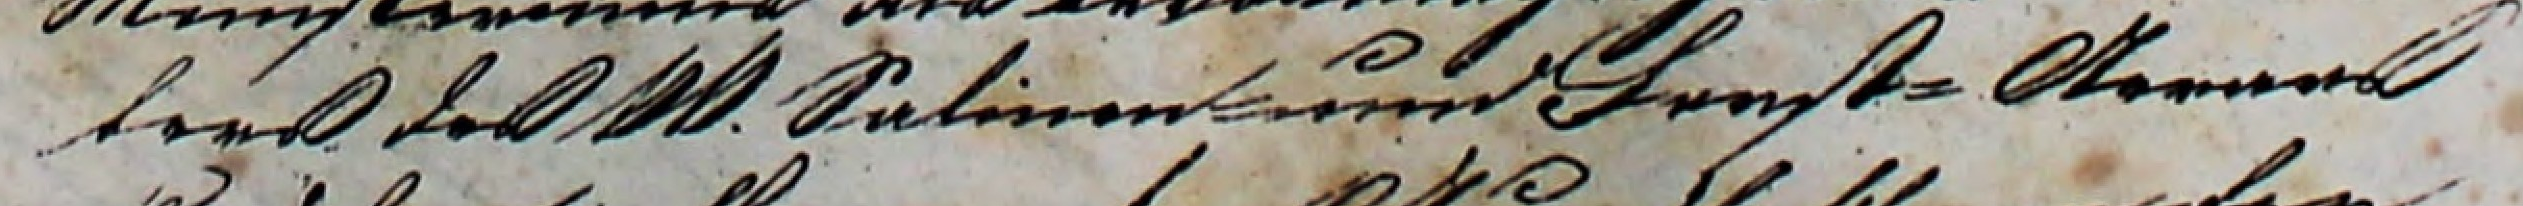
ters des k.k. Salinen= und Forst= Aerars
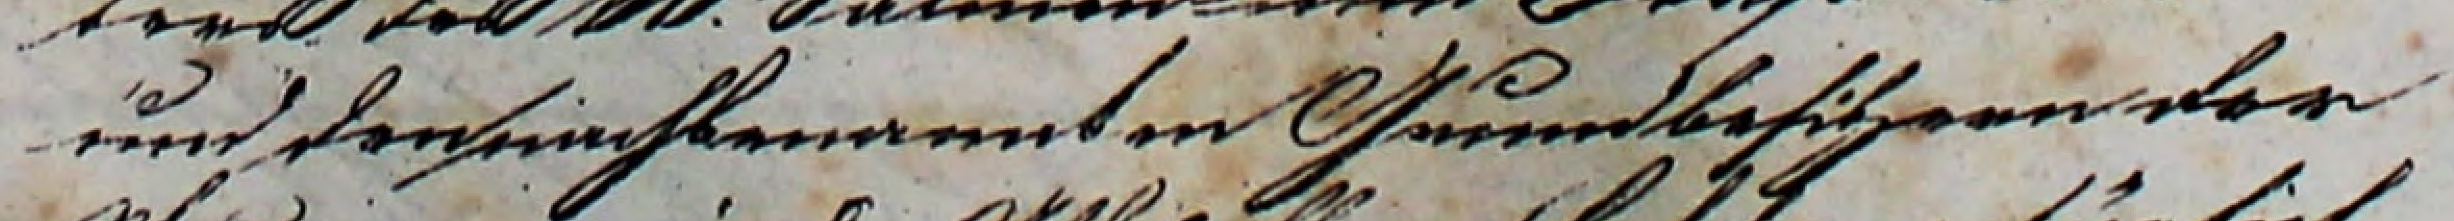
und den nachbenannten Grundbesitzern der
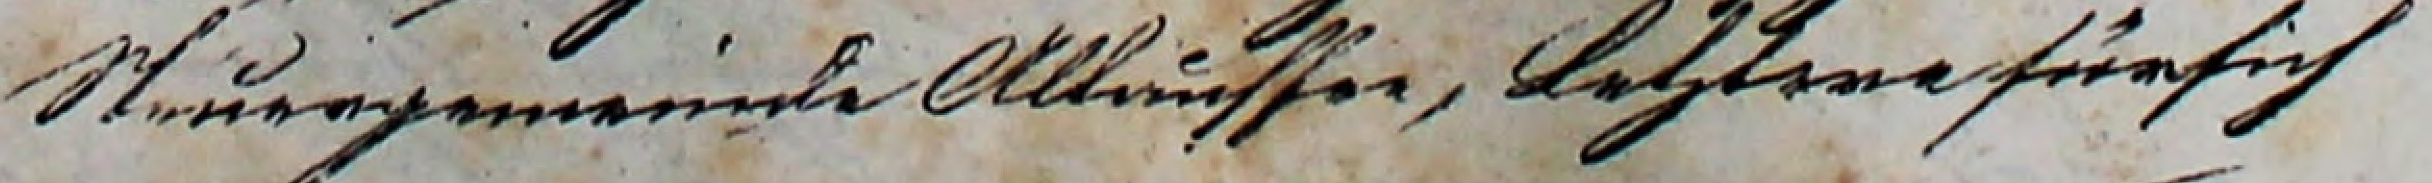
Steuergemeinde Altaussee, Letztere für sich
